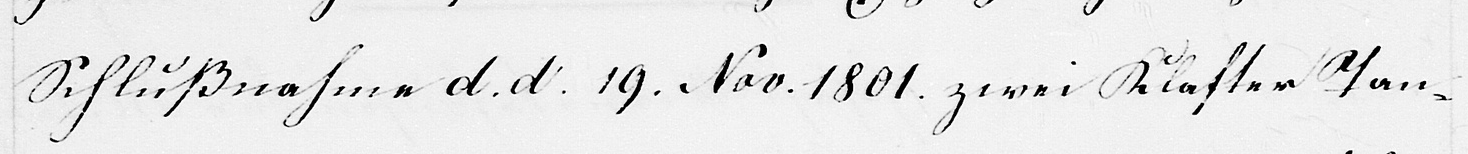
Schlußnahme d. d. 19. Nov. 1801. zwei Klafter Tan¬
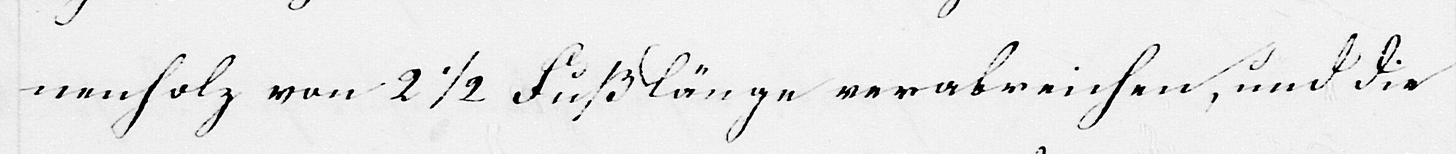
nenholz von 2 ½ Fuß länge verabreichen, und die
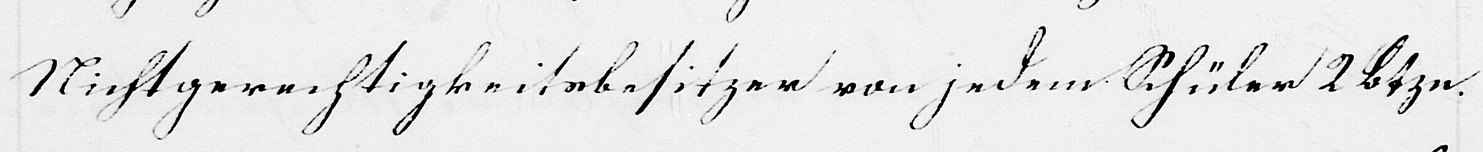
Nichtgerechtigkeitsbesitzer von jedem Schüler 2 Btzn.
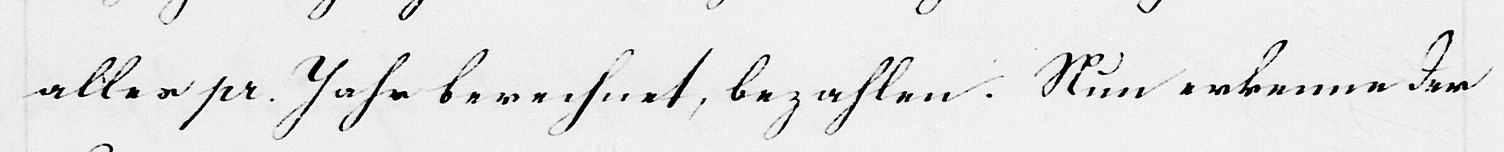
alles pr. Jahr berechnet, bezahlen. Nun erkenne der
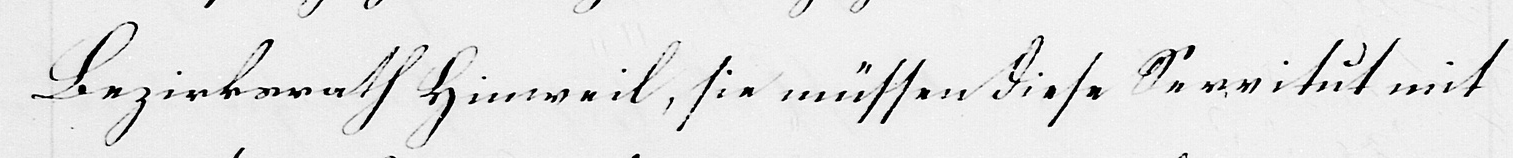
Bezirksrath Hinweil, sie müssen diese Servitut mit
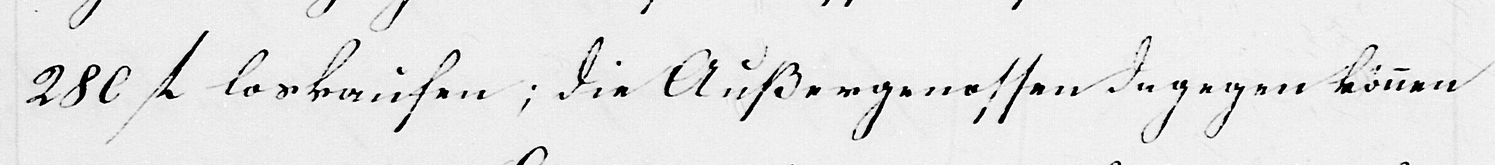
280 fl loskaufen; die Außergenossen dagegen können
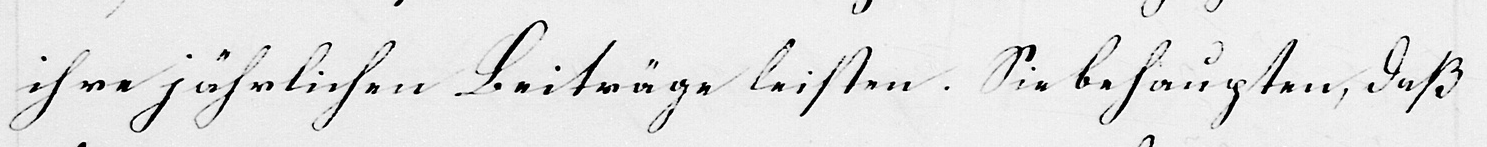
ihre jährlichen Beiträge leisten. Sie behaupten, daß
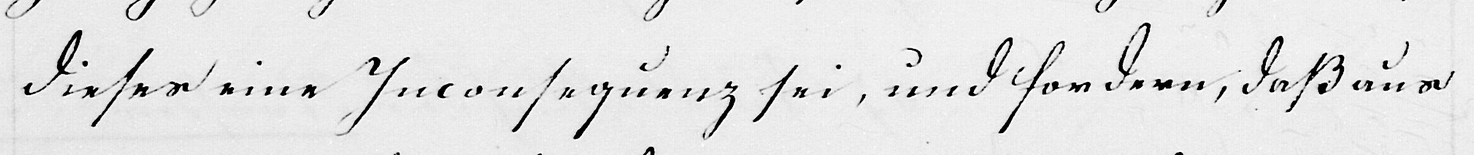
dieses eine Inconsequenz sei, und fordern, daß aus
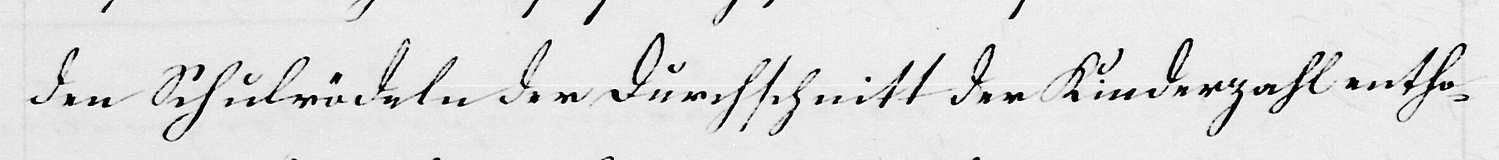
den Schulrödeln der Durchschnitt der Kinderzahl entho¬
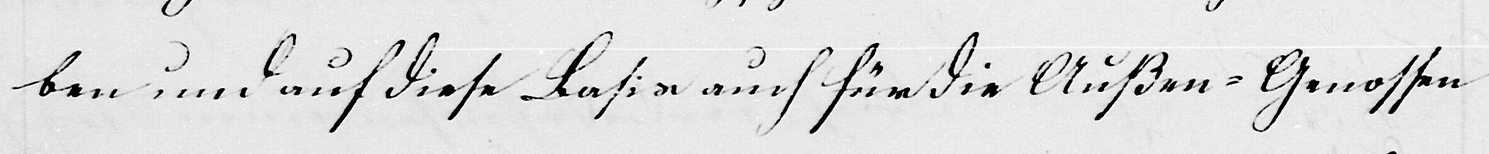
ben und auf diese Basis auch für die Außen-Genossen
